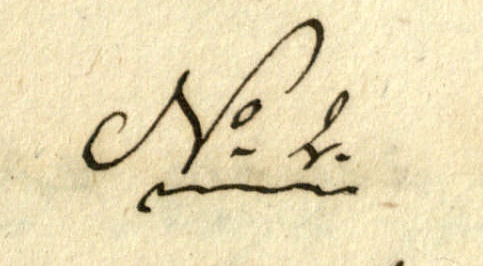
No 2.
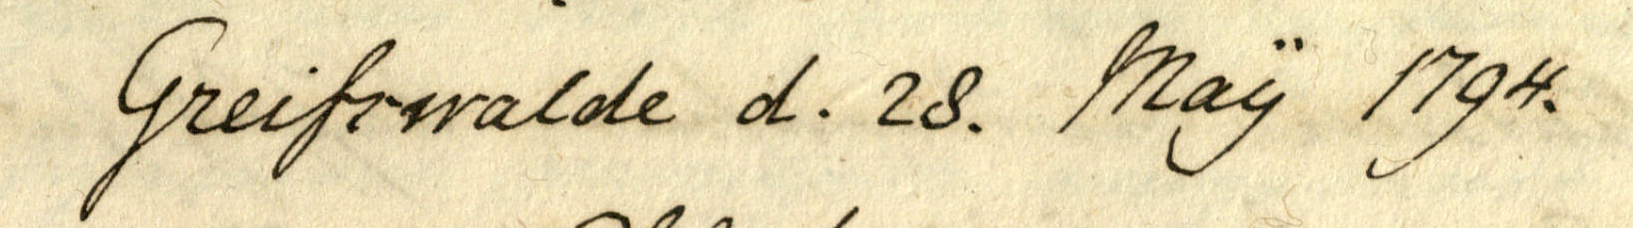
Greifswalde d. 28. May 1794.
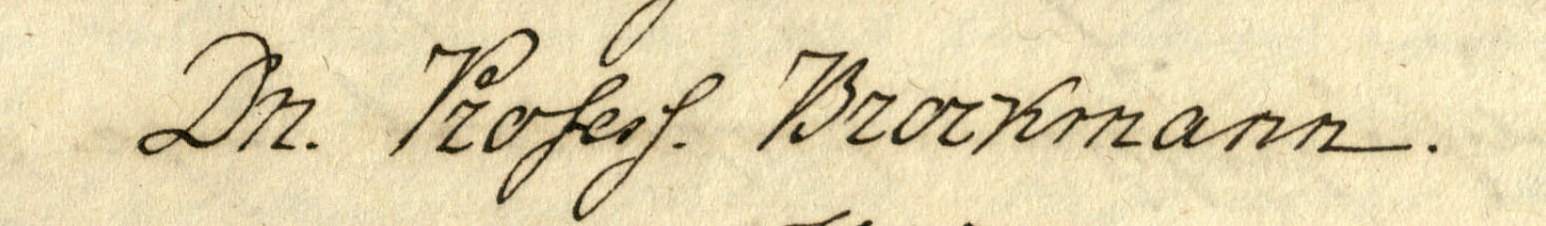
Dn. Profess. Brockmann.
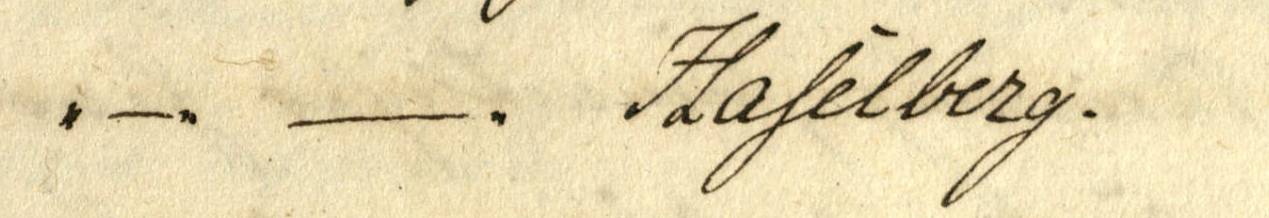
" - " - " Haselberg.
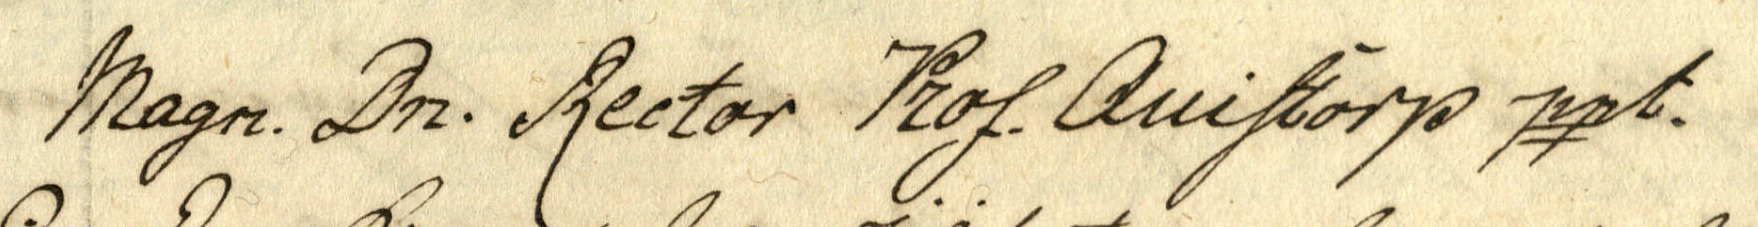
Magn. Dn. Recotr. Prof. Quistorp ppt.
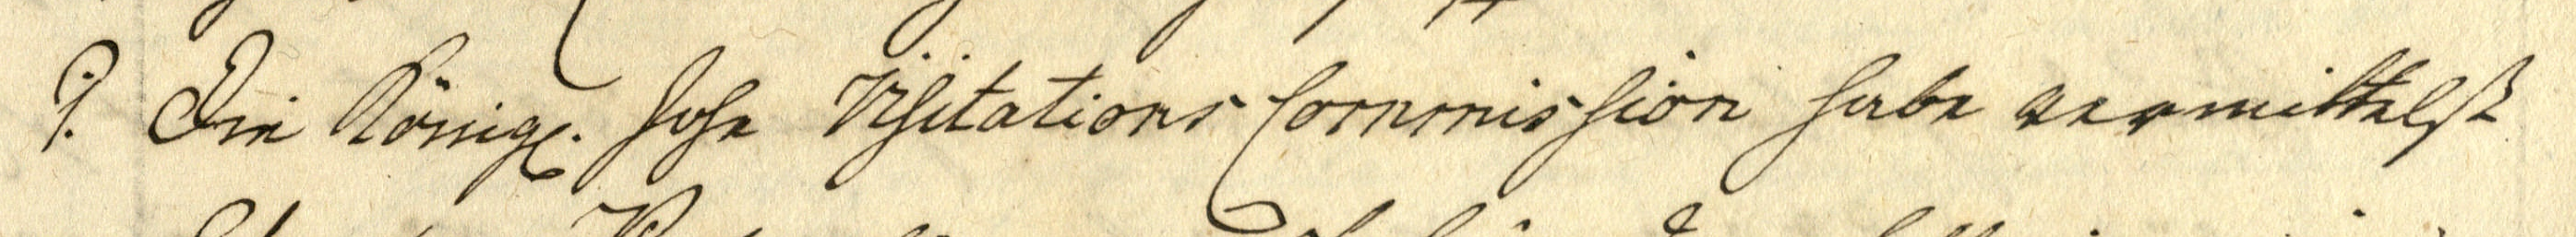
1.) Die Königl. Visitations Commission habe vermittelst
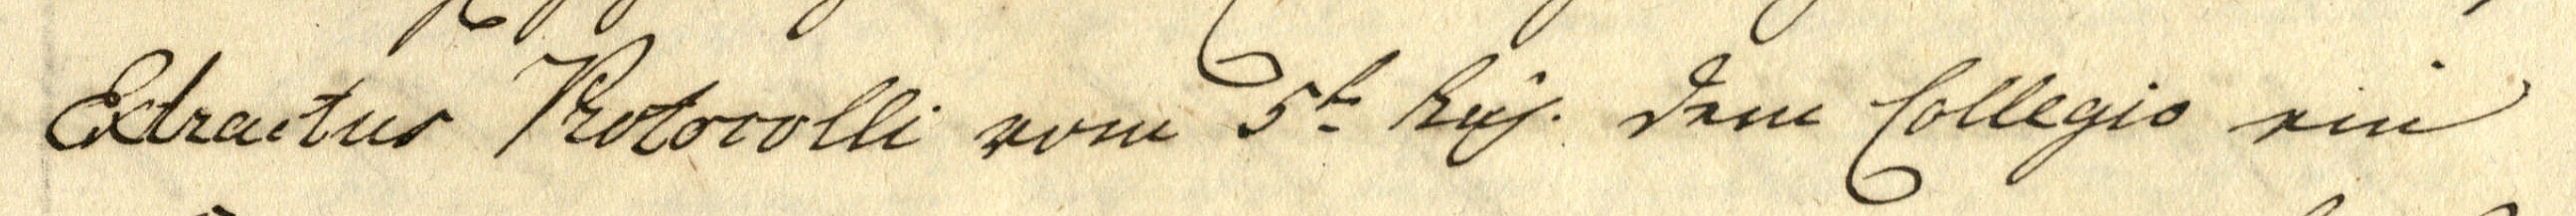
Extractus Protocolli vom 5t. huj. dem Collegio ein
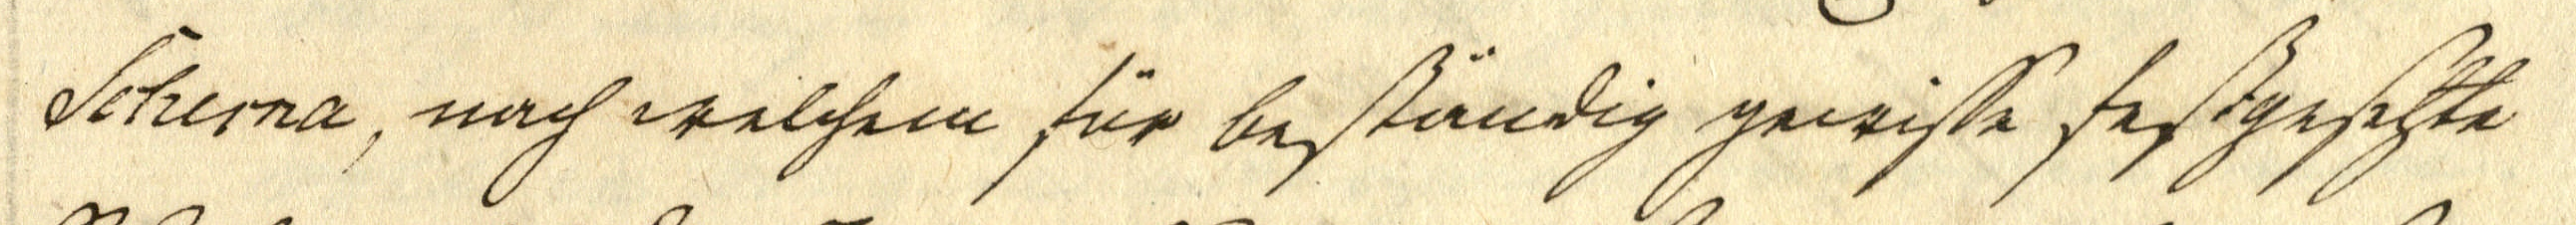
Schema, nach welchem für beständig gewisse festgesetzte
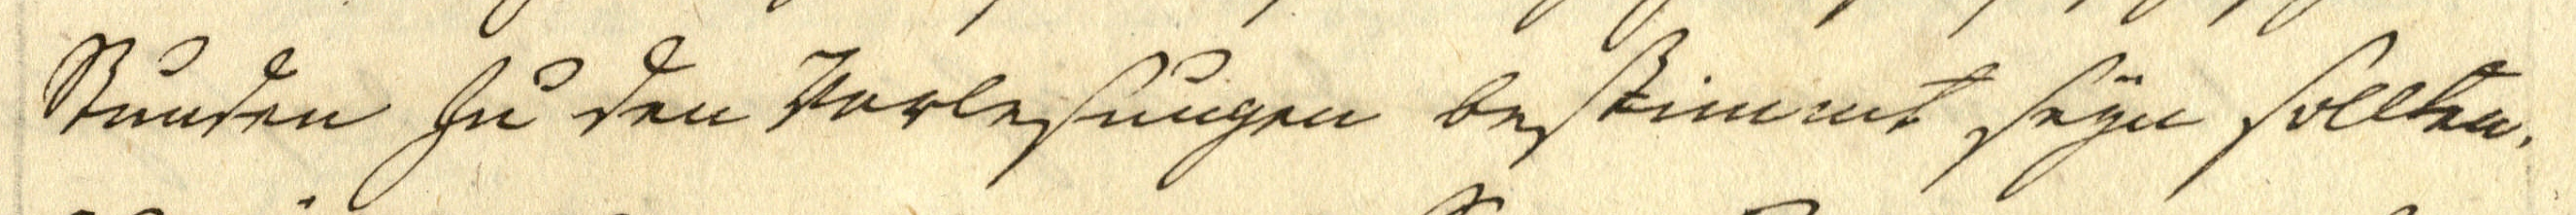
Stunden zu den Vorlesungen bestimmt seyn sollten,
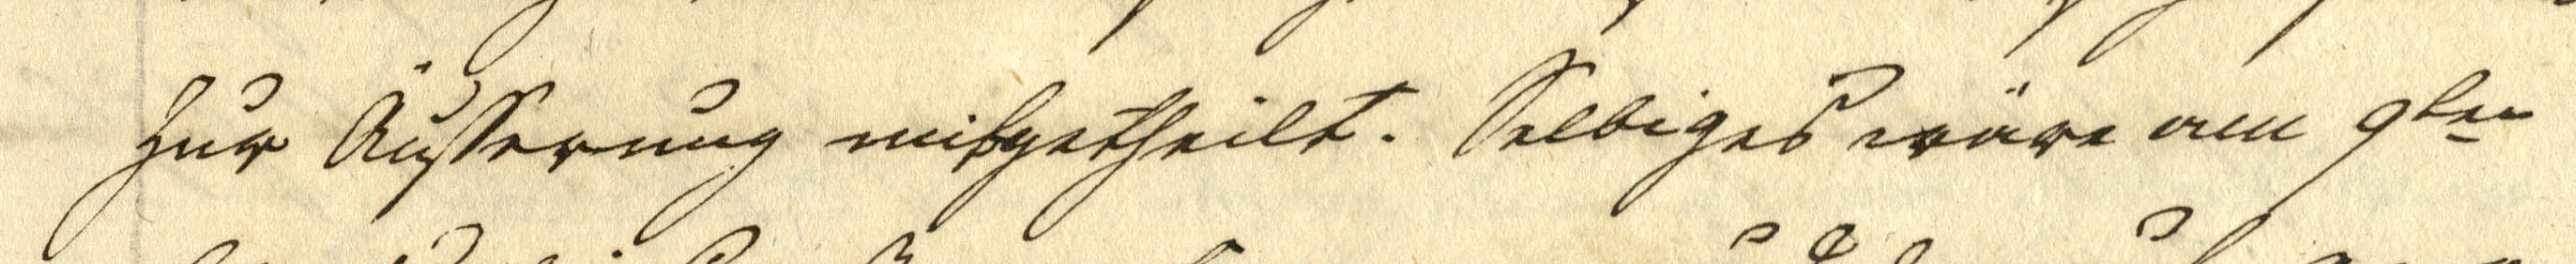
zur Äusserung mitgetheilt. Selbiges wäre am 9ten
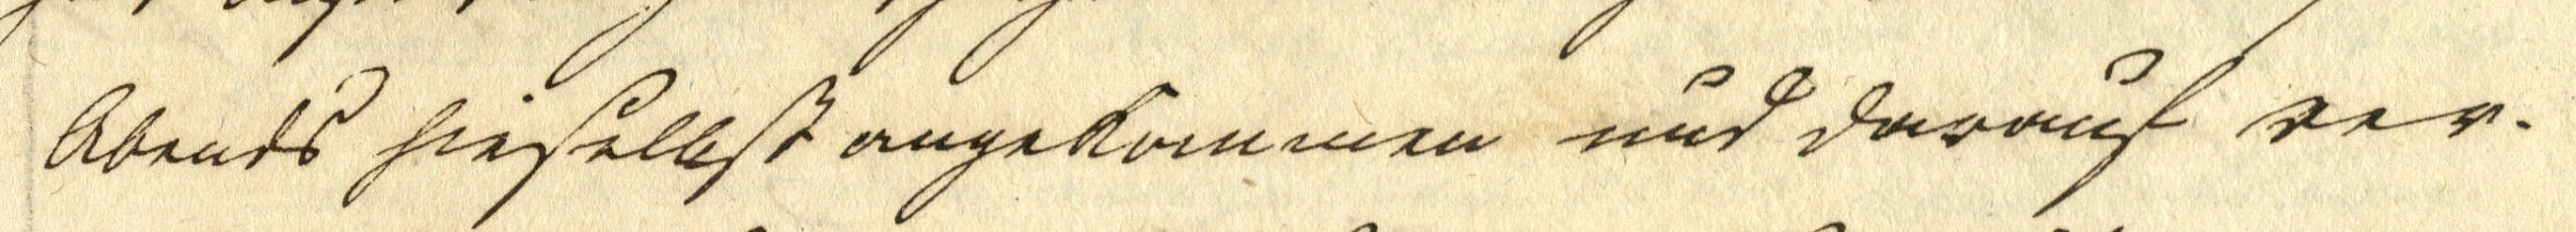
Abends hieselbst angekommen und darauf ver-
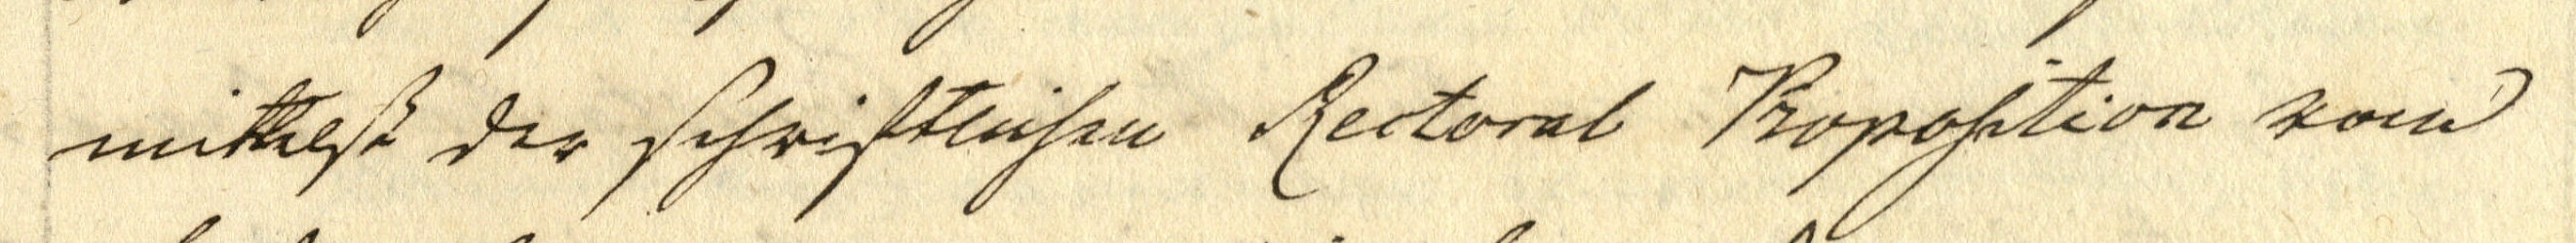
mittelst der schriftlichen Recotrat Proposition vom
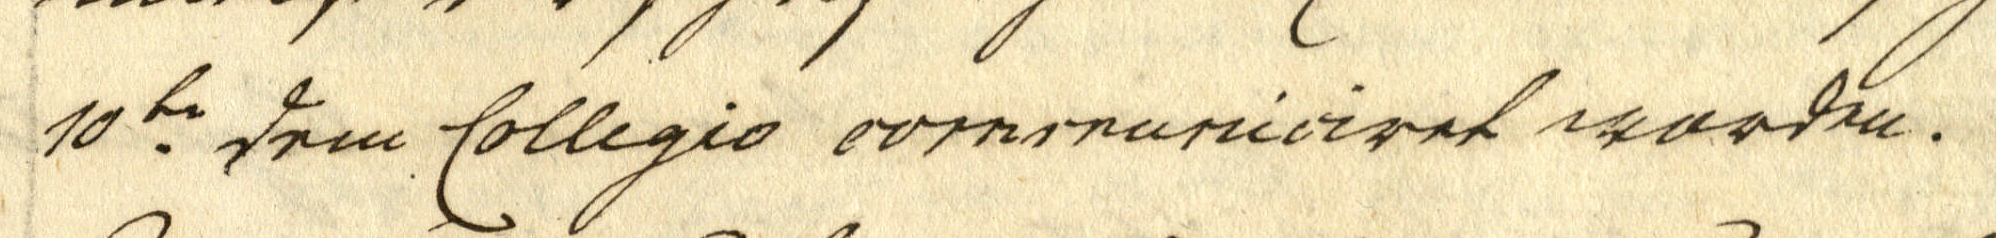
10ten dem Collegio communiciret worden.
